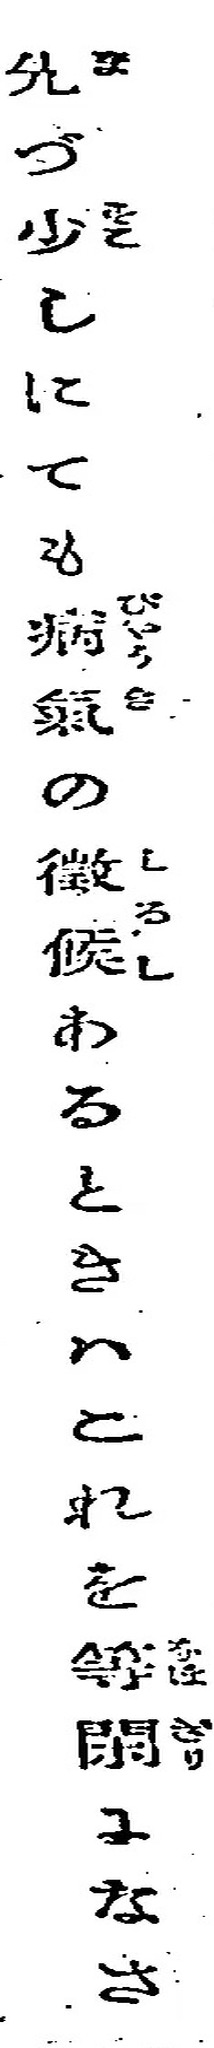先づ少しにても病気の徴候あるときはこれを等閑になさ
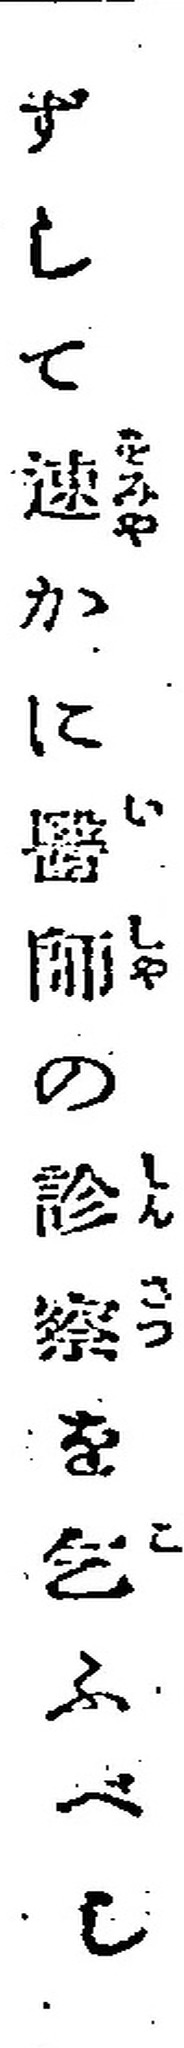ずして速かに醫師の診察を乞ふべし
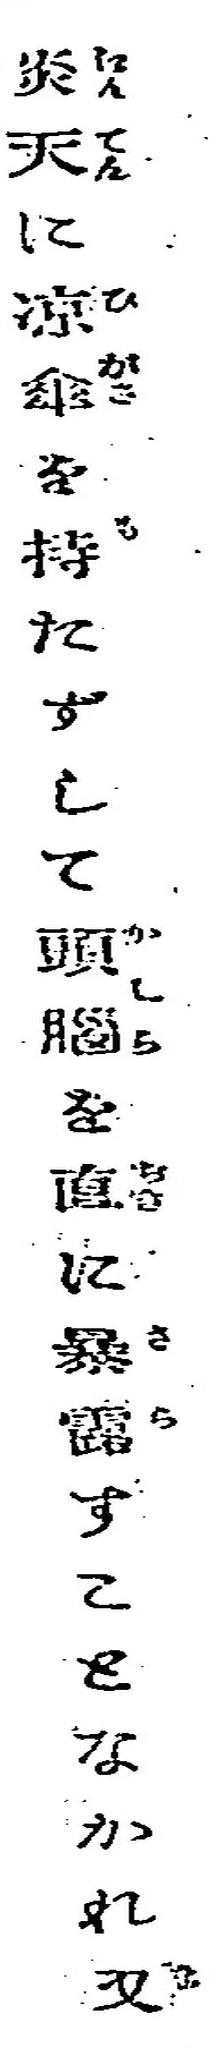炎天に涼傘を持たずして頭脳を直に暴露ことなから又
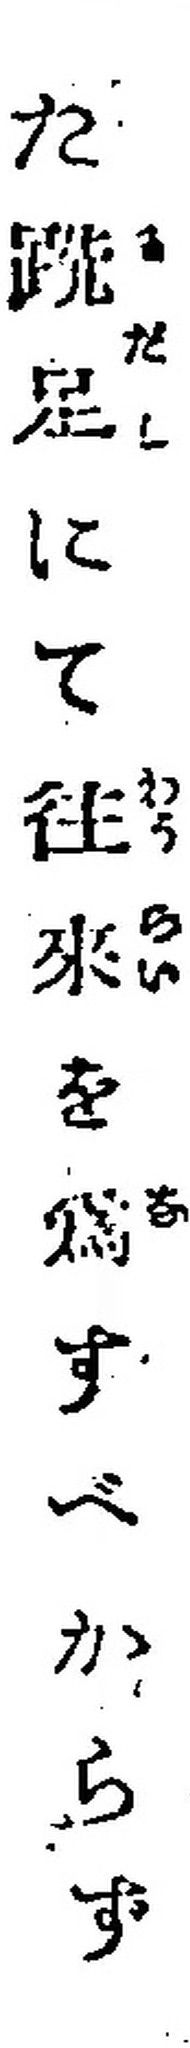跣足にて往来を為すべからず
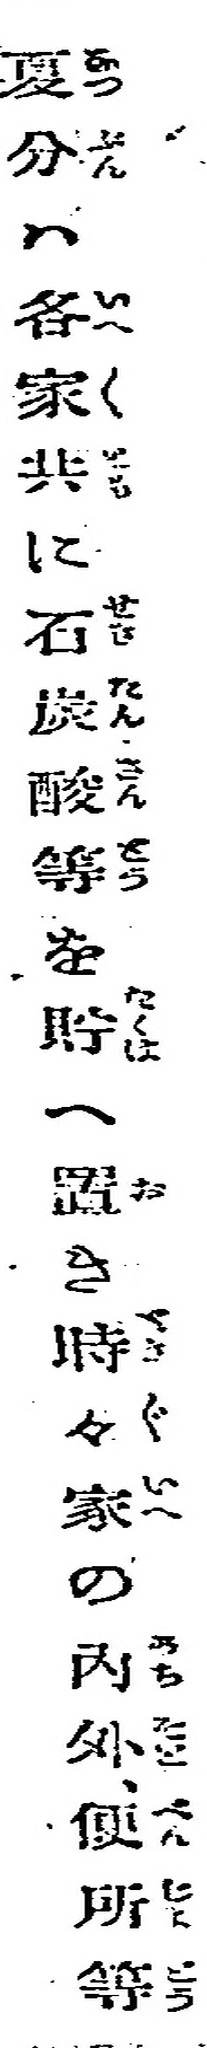夏分は各家共に石炭酸等を貯へ置き時々家の内外、便所等
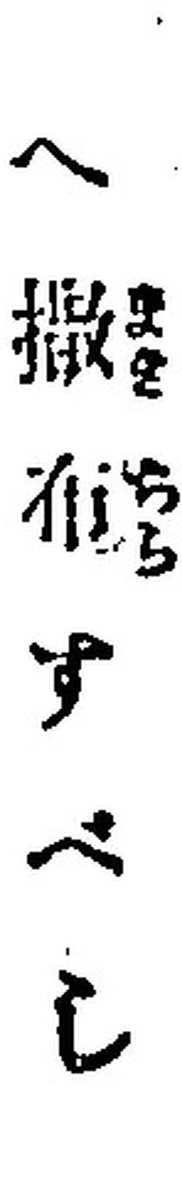へ撒布すべし
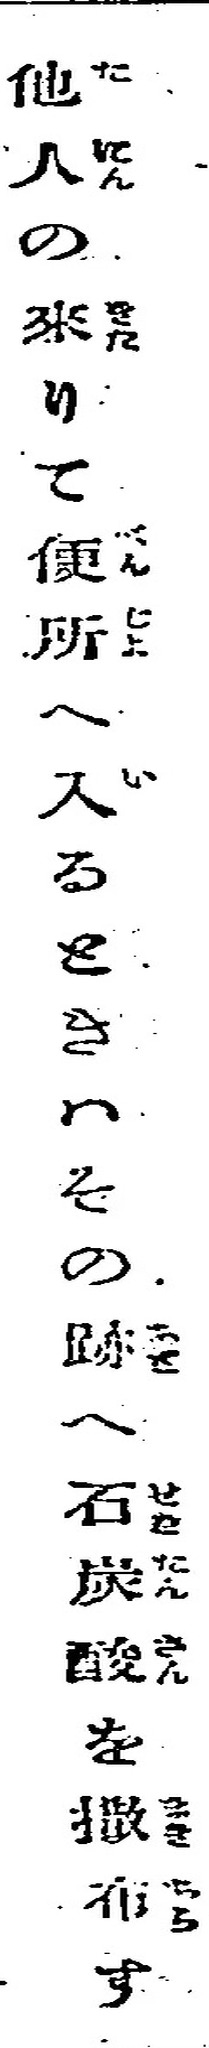他人の来りて便所へ入るときはその跡へ石炭酸を撒布す
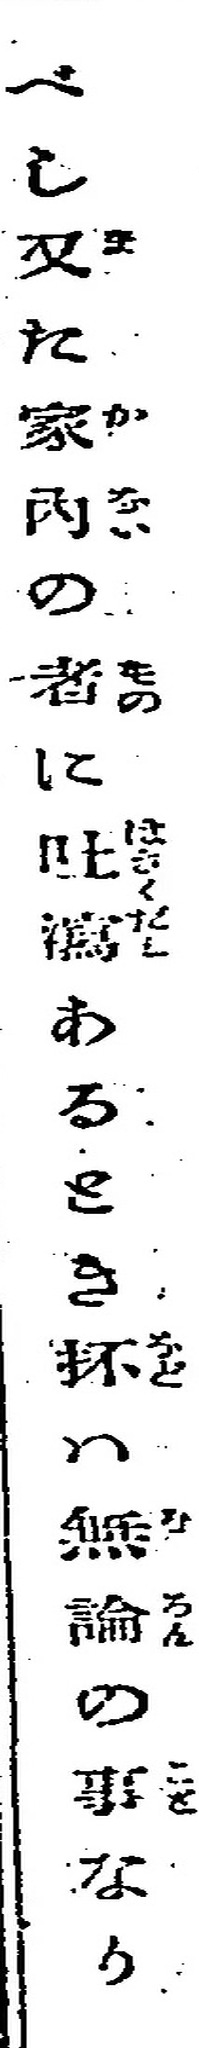べし又た家内の者に吐瀉あるとき抔は無論の事なり

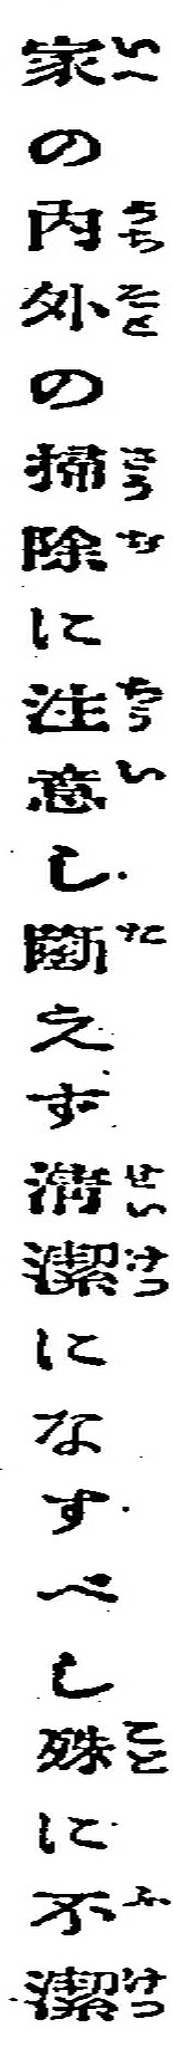家の内外の掃除に注意し断えず清潔になすべし殊に不潔
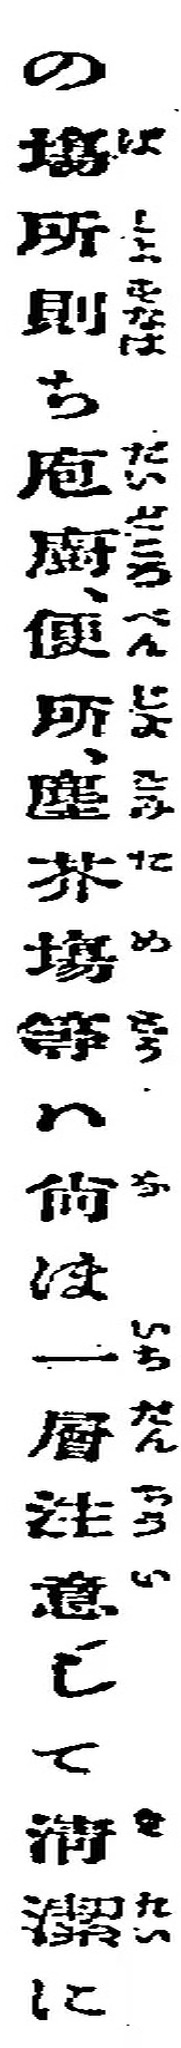の場所則ち庖厨、便所、塵芥場等は尚ほ一層注意して清潔に
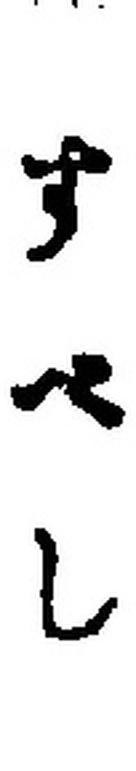すべし
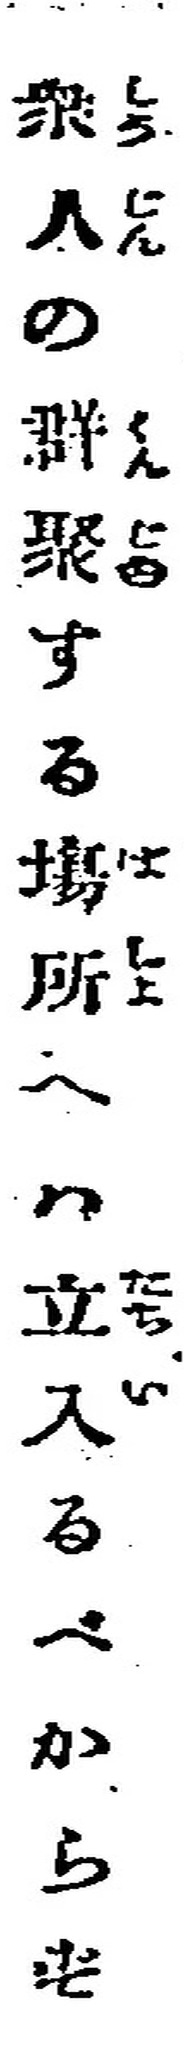衆人の群聚する場所へは立入るべからず
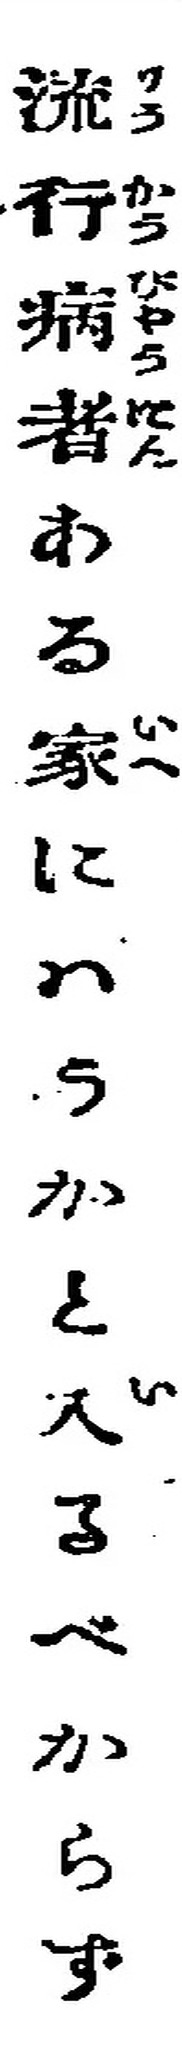流行病者ある家にはうかと入るべからず
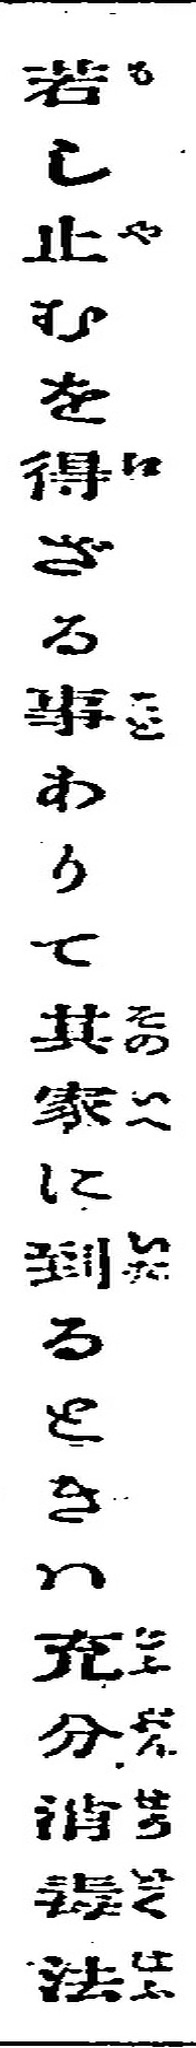若し止むを得ざる事ありて其家に到るときは充分消毒法
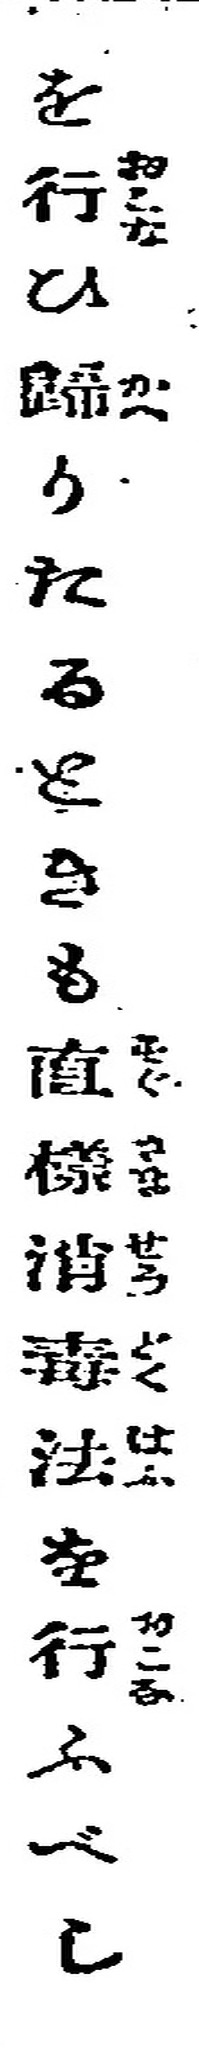を行ひ帰りたるとみも直様消毒法を行ふべし
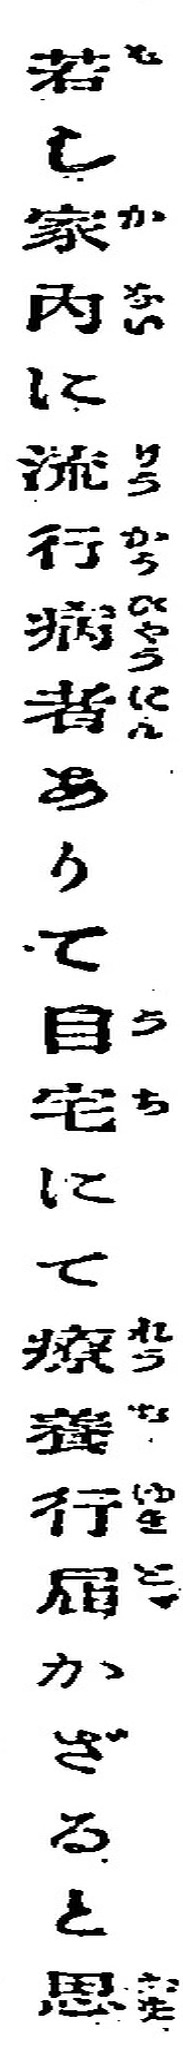若し家内に流行病者ありて自宅にて療養行届かざると思
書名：新撰暑中養生法 : 附・コレラ予防歌
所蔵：国立国会図書館 National Diet Library, JAPAN
